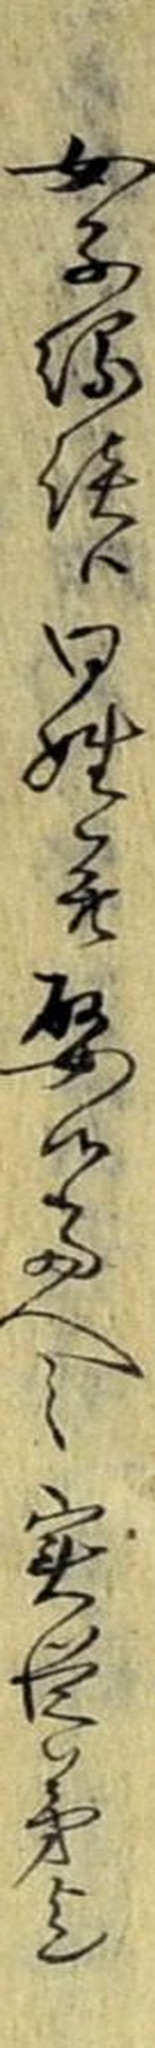女子縁組ハ同姓幷娶候当人之実従弟迄
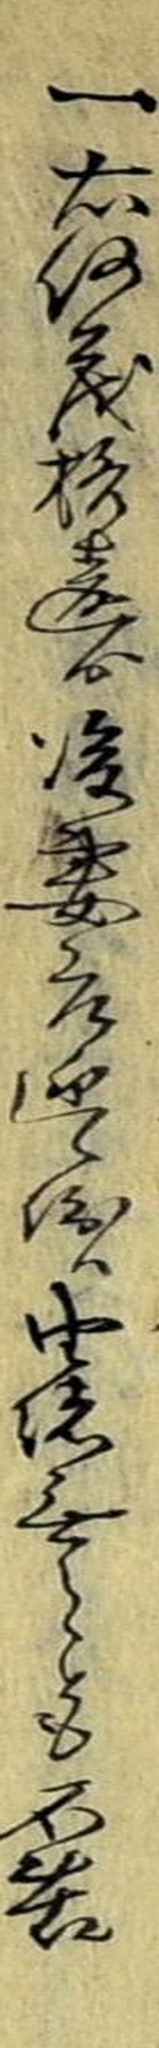一右何茂格違ゟ後妻取迎候儀ハ由緒無之候とも不苦
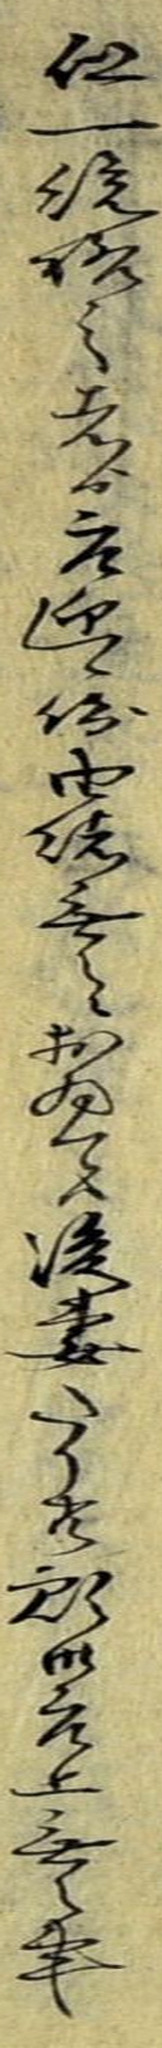但一統格之者ゟ取迎候儀由緒無之ニおゐてハ後妻たり共願御取上無之事
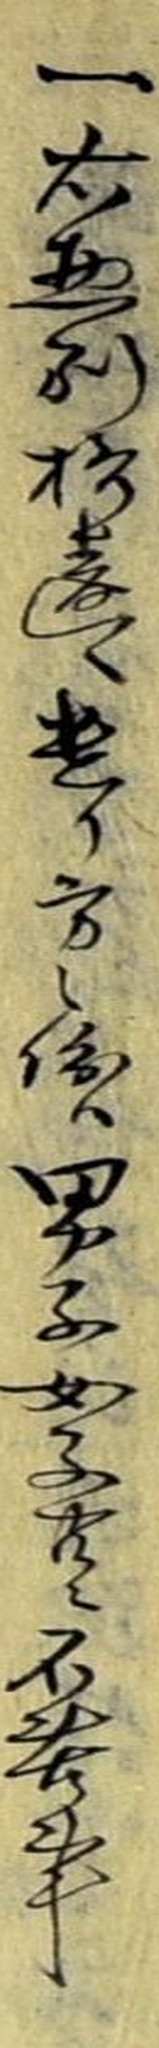一右惣別格違へ遣り方之儀ハ男子女子共ニ不苦事

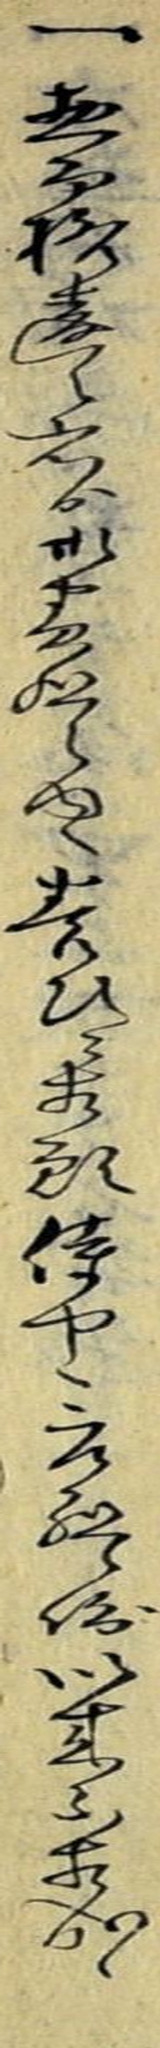一惣而格違之者ゟ御番組之内へ養ひニ相願侍中へ取組候儀以来不相成候
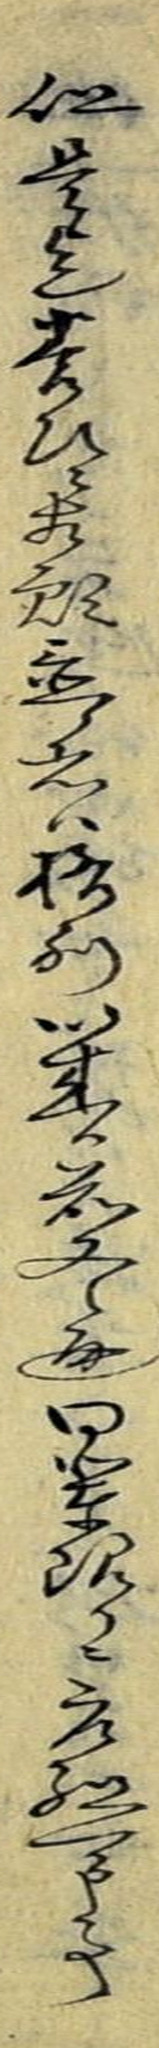但是迄養ひニ相願置候者ハ格別以来ハ前文之通同輩限りニ取組可申事
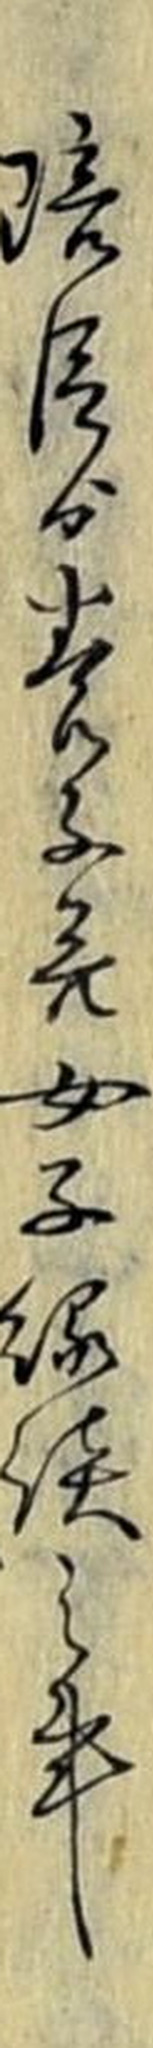陪臣ゟ養子并女子縁談之事
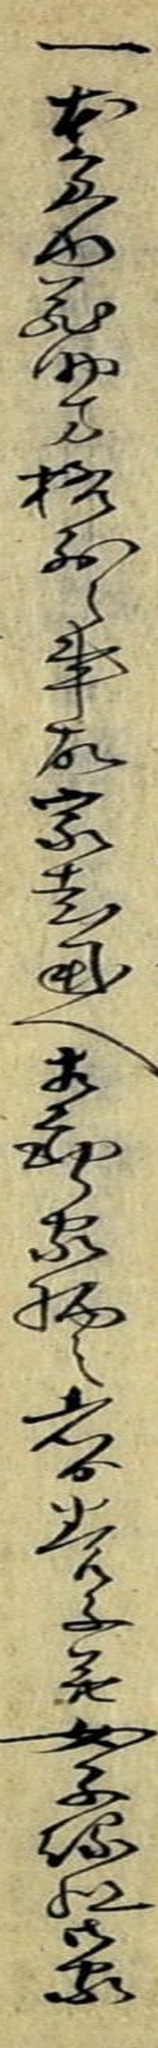一本多内蔵助方格別之事故家老用人相勤候家柄之者ゟ養子并女子縁組御家
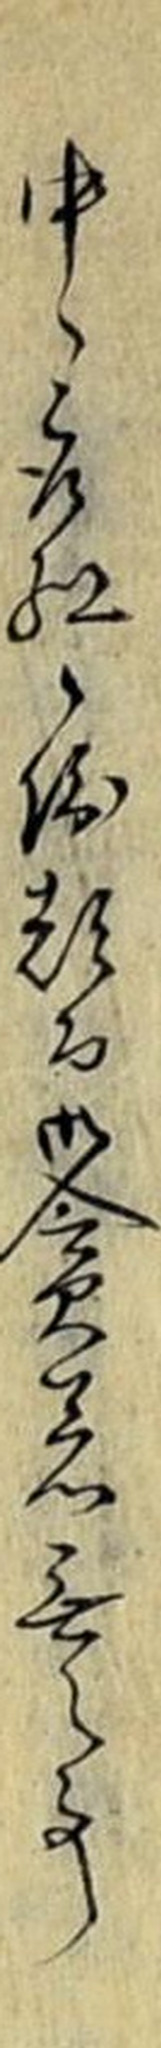中へ取組候儀都而御貪着無之事
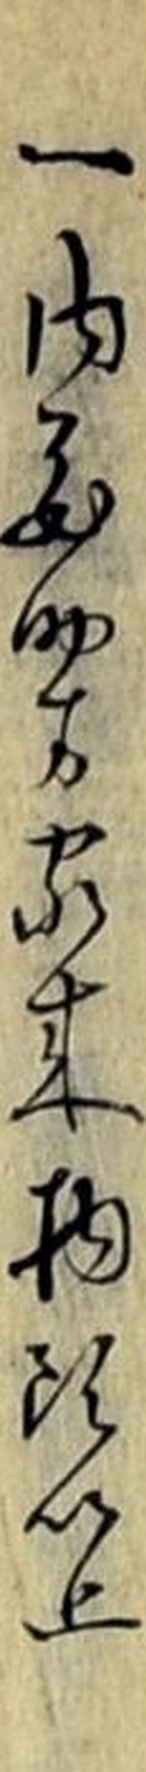一内蔵助方家来物頭以上
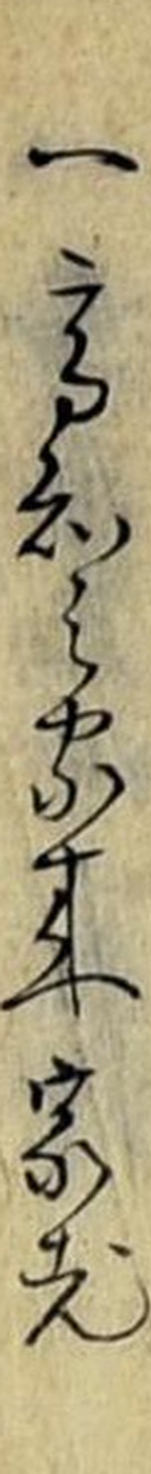一高知之家来家老
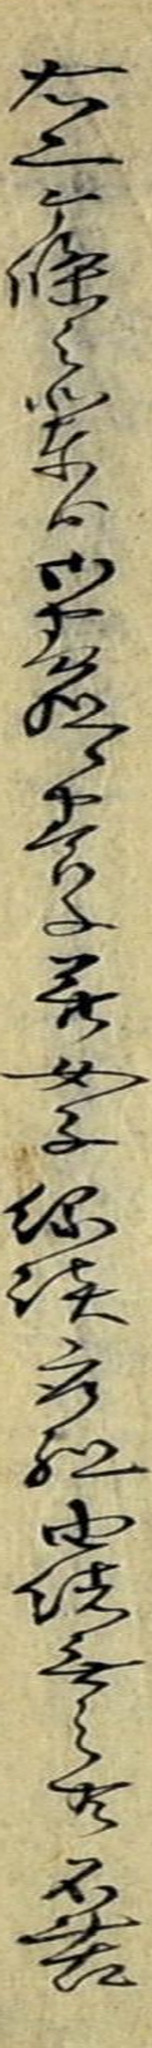右二ケ条之輩ゟ御番組へ養子并女子縁談取組由緒無之共不苦
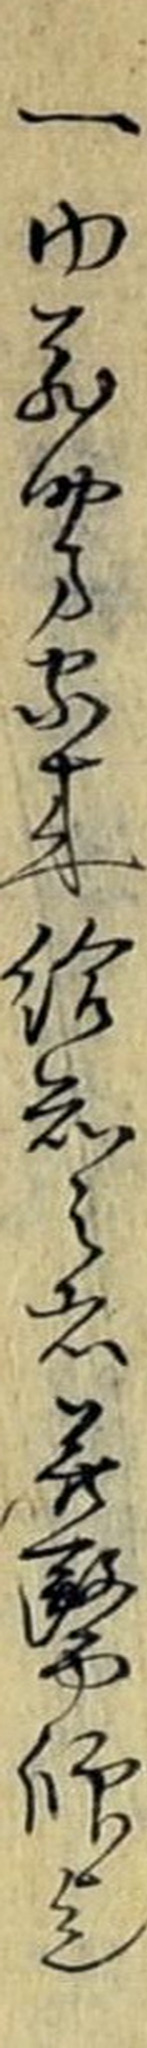一内蔵助方家来給地之者并医師迄
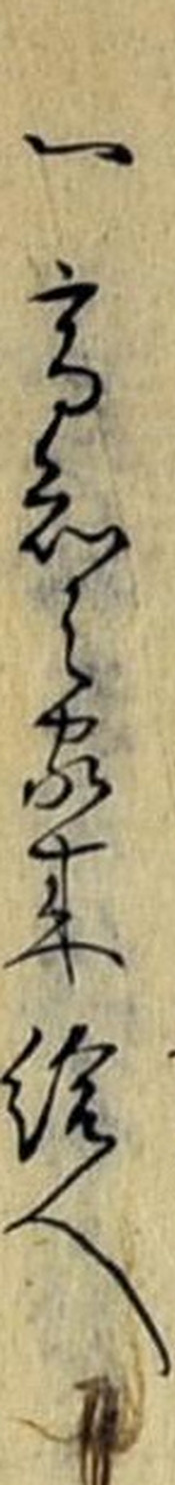一高知之家来給人
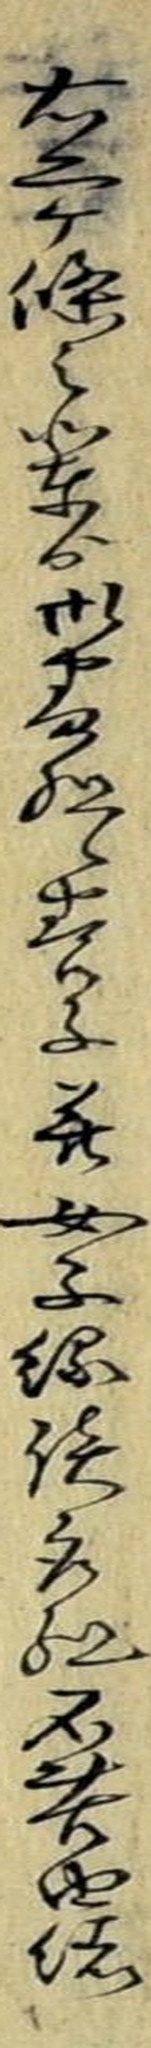右二ケ条之輩ゟ御番組へ養子并女子縁談取組不苦由緒
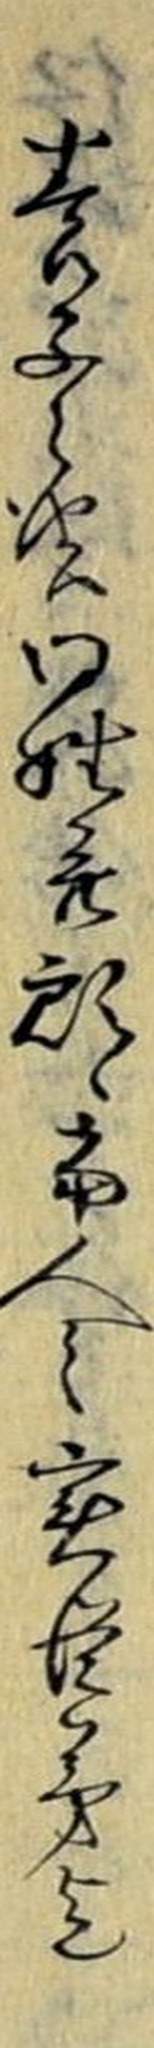養子之儀ハ同姓并願候当人之実従弟迄
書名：命令之部 三
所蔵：福井県文書館 Fukui Prefectural Archives
